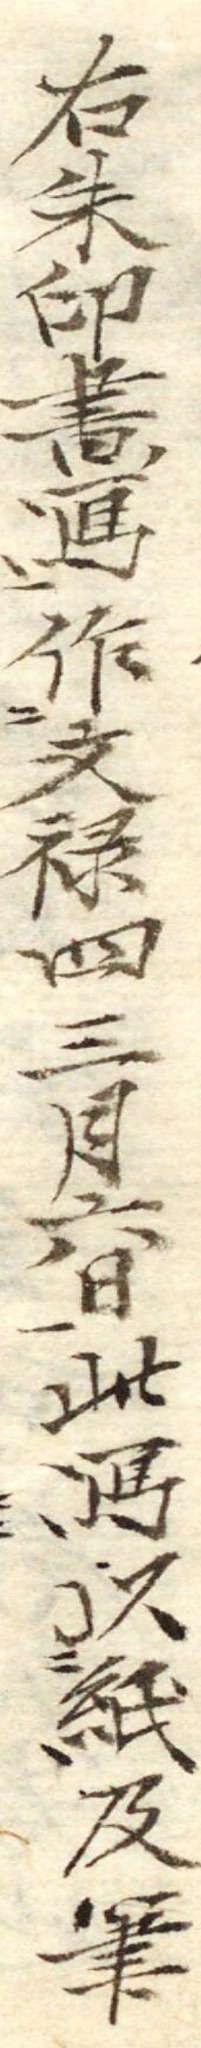右朱印書の写作文禄四三月六日此写以紙及筆
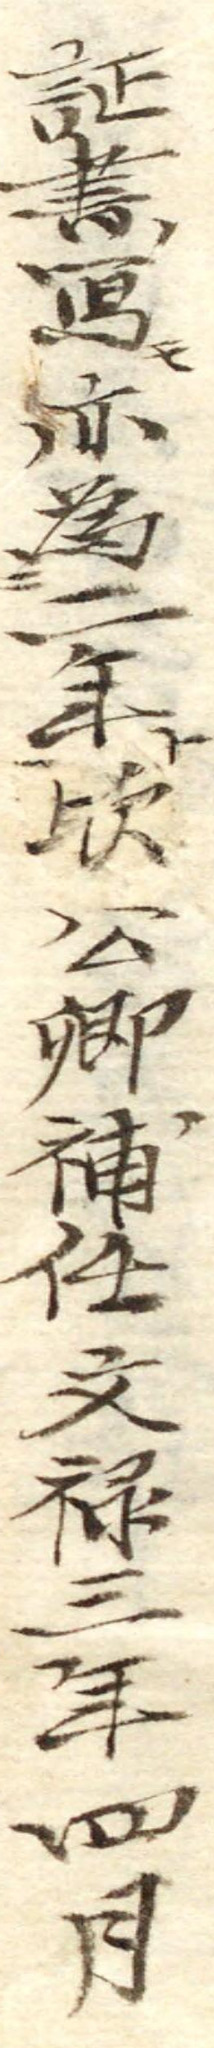証書の写も亦為二年と歟公卿補任文禄三年四月
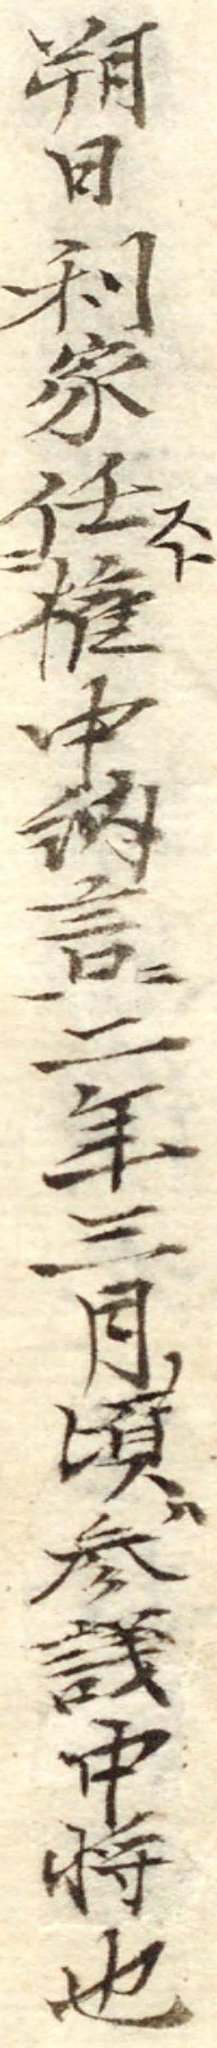朔日利家任すと権中納言に二年三月の頃は参議中将也
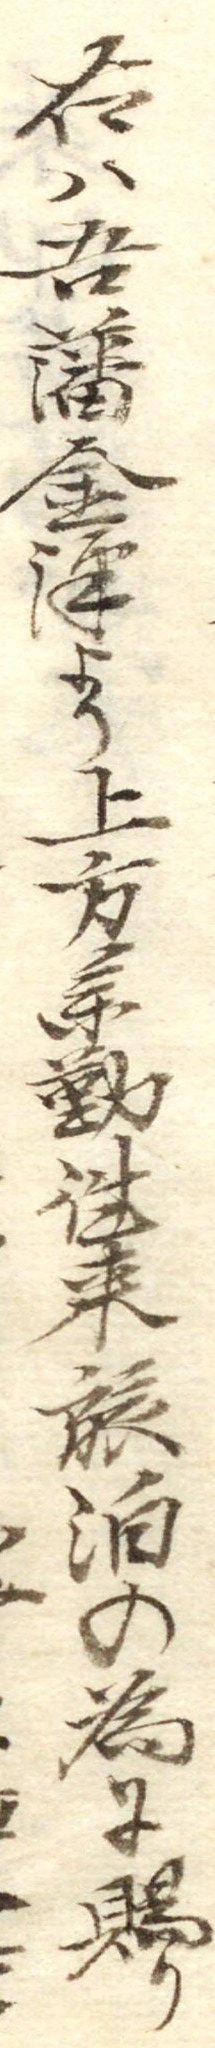右は吾藩金沢より上方参勤往来旅泊の為尓賜り
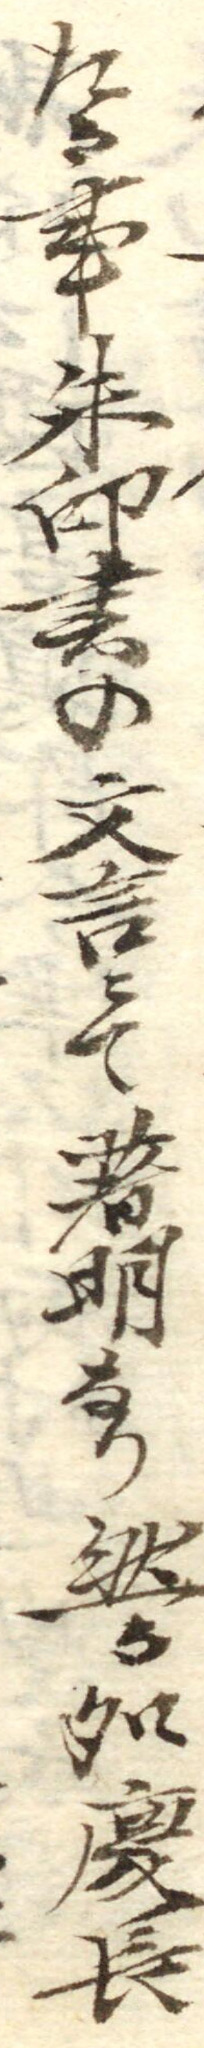たき事朱印書の文言にて著明なり然る処慶長
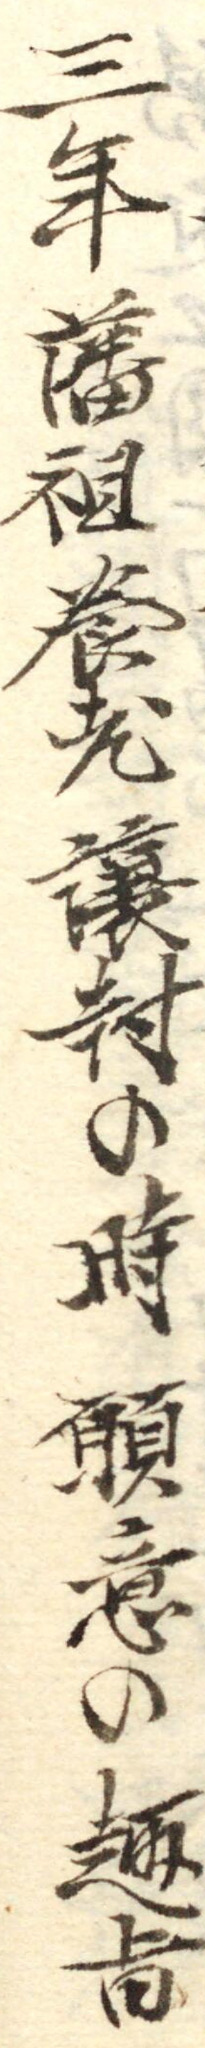三年藩祖養老譲封の時願意の趣旨
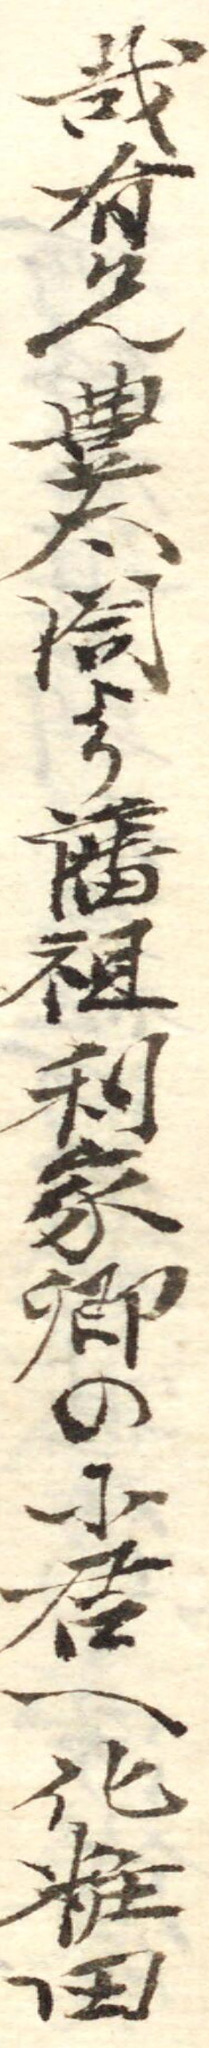哉有見豊太閤より藩祖利家卿の小君へ化粧田
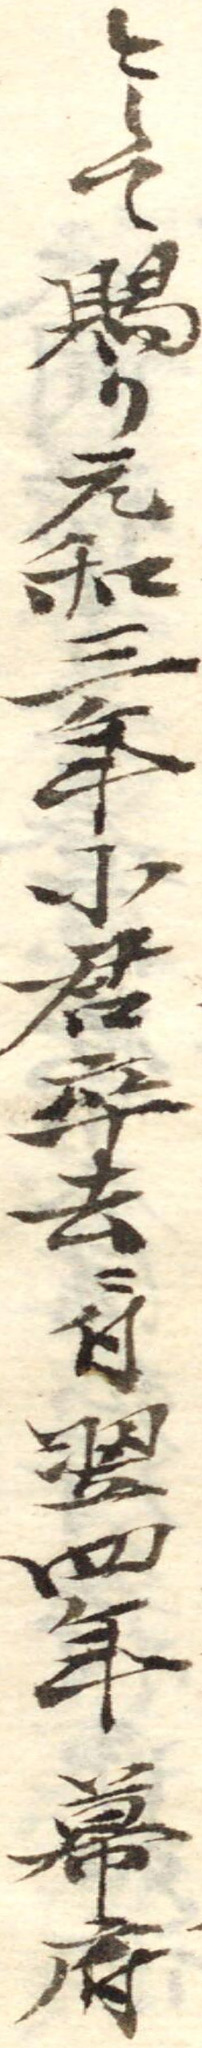として賜り元和三年小君卒去に付翌四年幕府
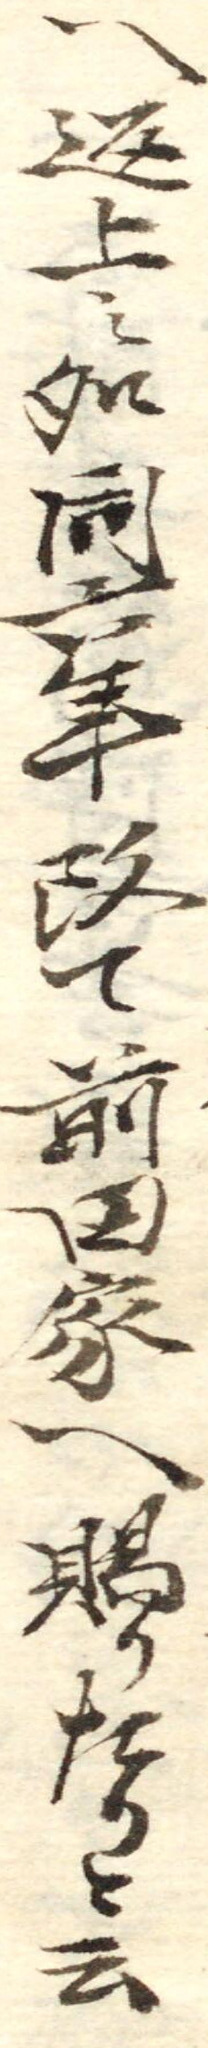へ返上之処同六年改て前田家へ賜りたりと云
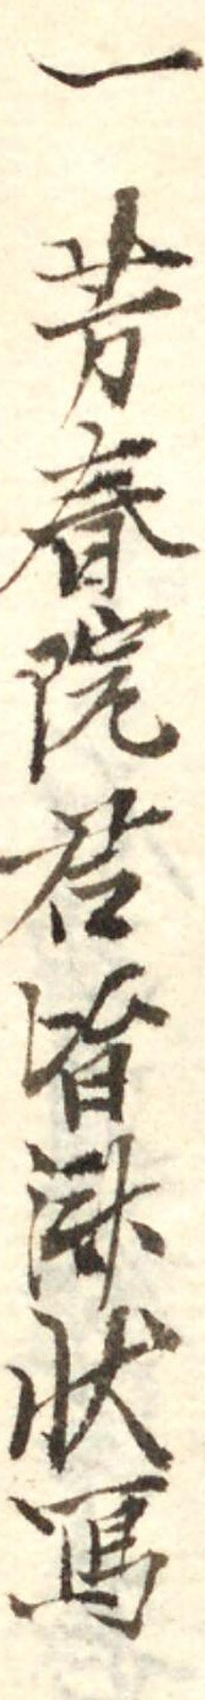一芳春院君皆済状写
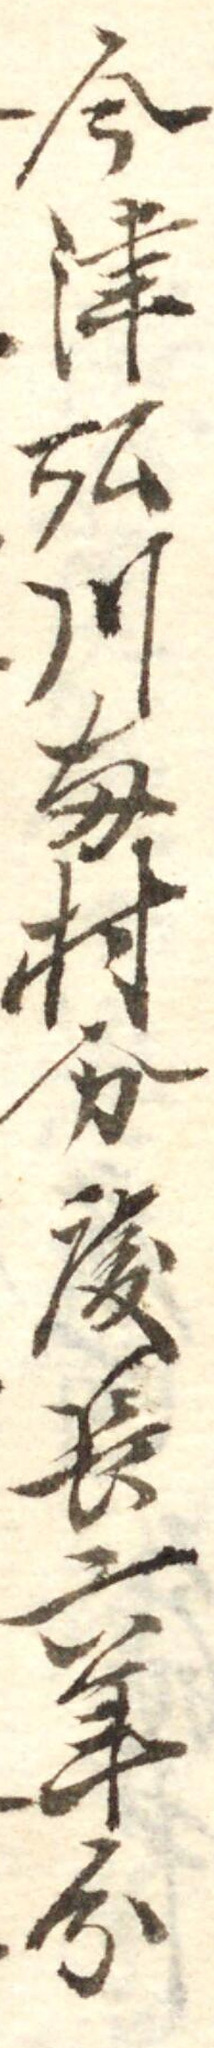今津弘川両村分慶長六年分
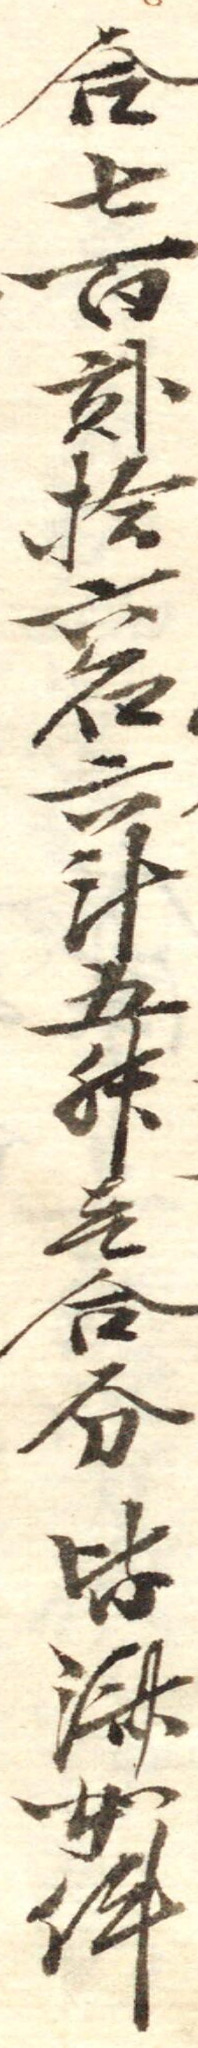合七百貳拾六石六斗五升壱合分皆済如件
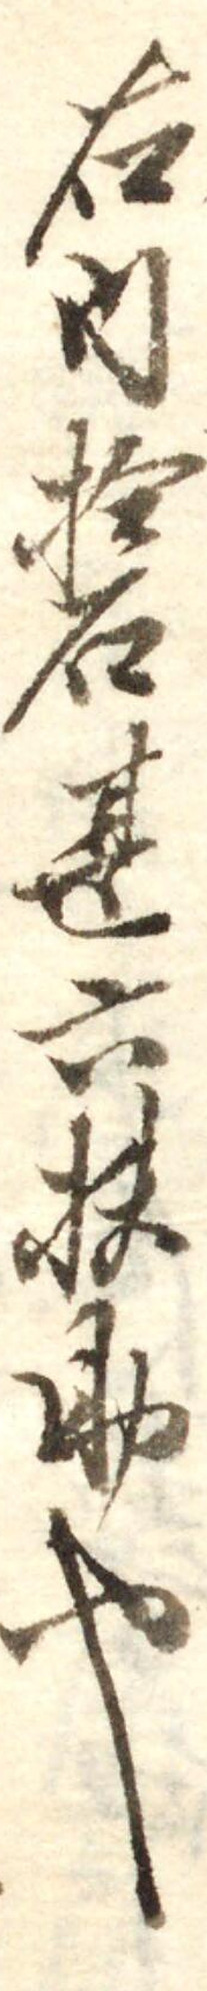右内拾石甚六扶助也
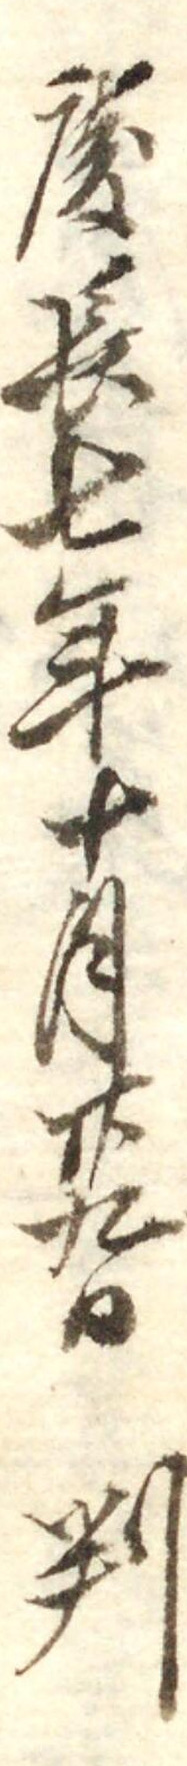慶長七年十月廿九日判

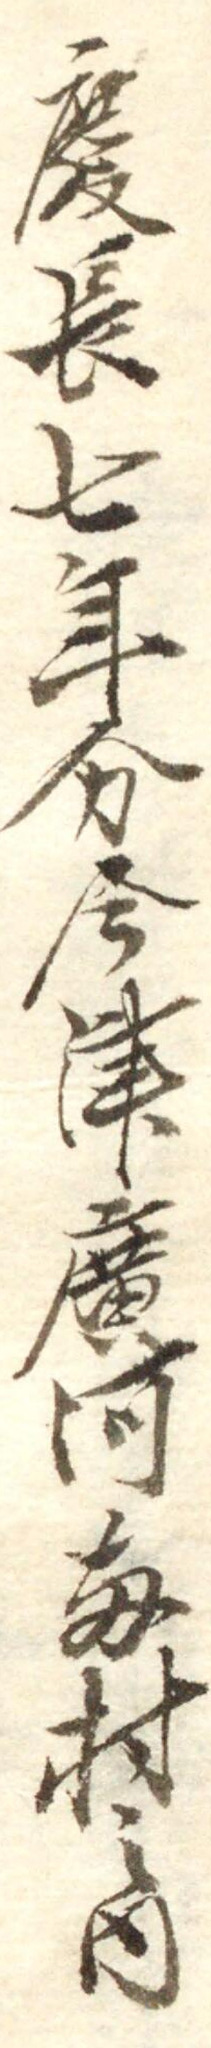慶長七年分今津廣河両村之内
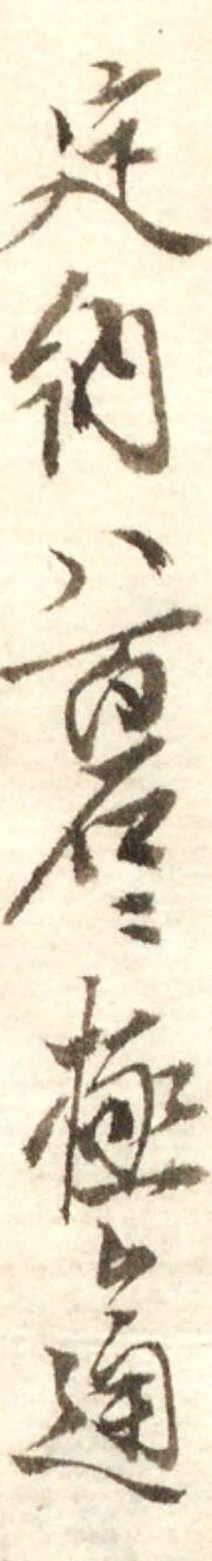定納は百石に極候通
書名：前田家封国証書集録
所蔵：Ishikawa Prefectural Library
